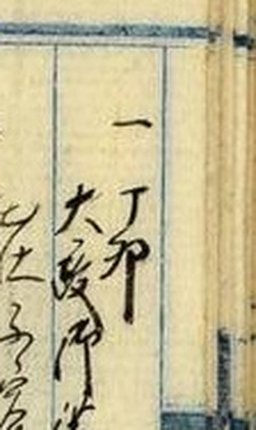一丁卯
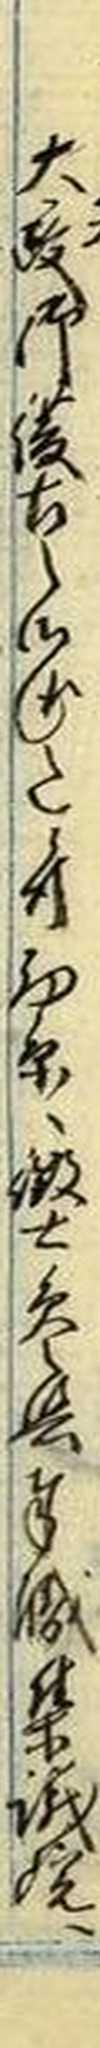大政御復古之御趣意ニ付西京へ徴士参与奉職集議院へ
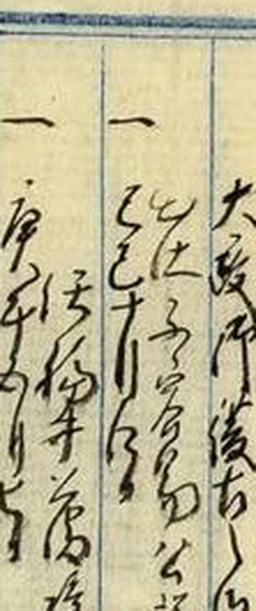一己巳十月四日
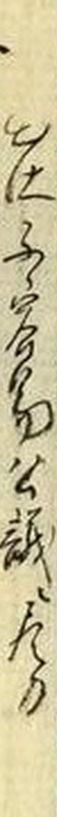出仕不容意公議ニ尽力
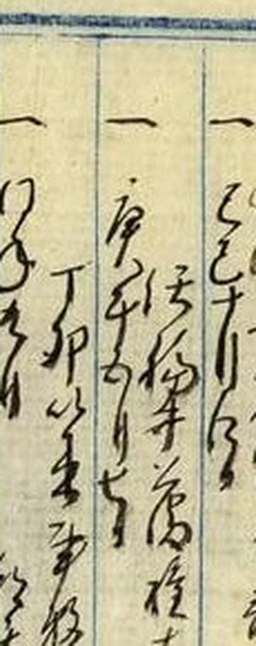一庚午五月七日
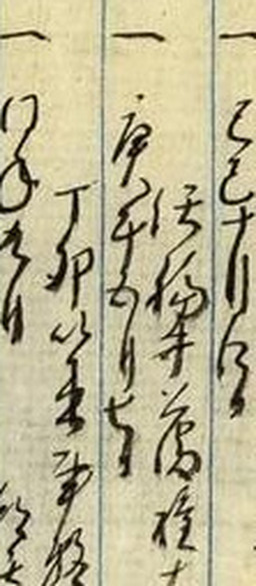一庚午五月七日
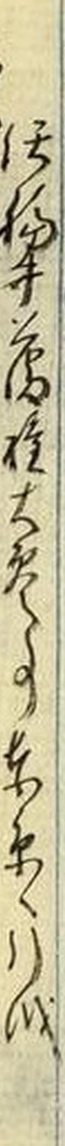任福井藩権大参事東京へ引越
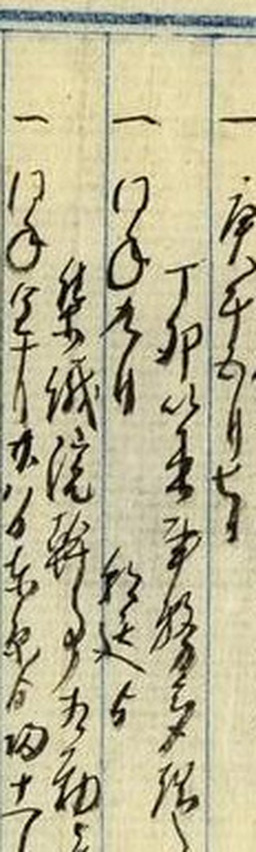一同年九月朝廷ゟ
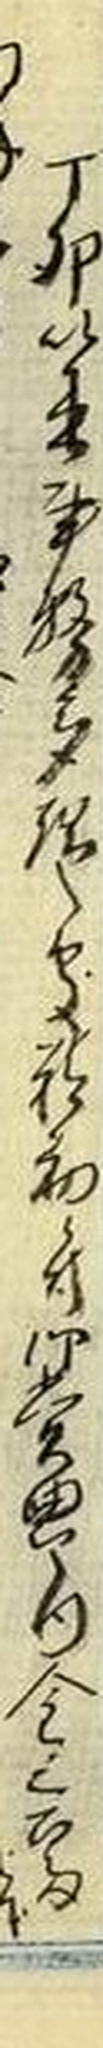丁卯以来事務多端之処精勤ニ付御賞典之内金三百両被下
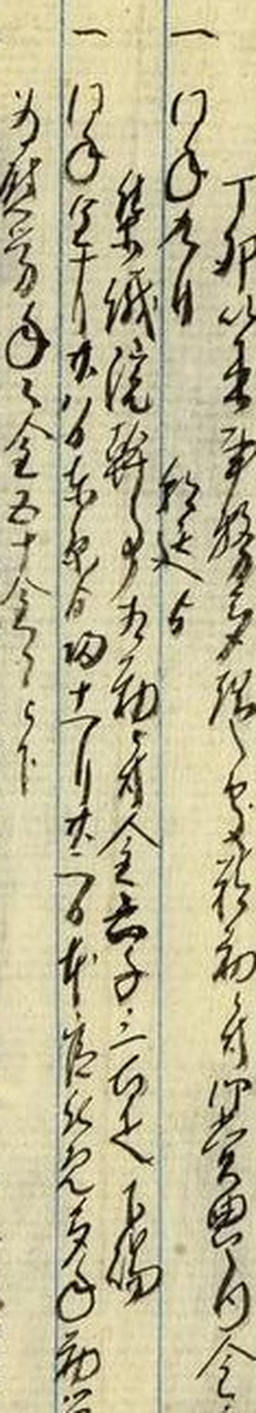集議院幹事相勤候付金六千三百疋下賜
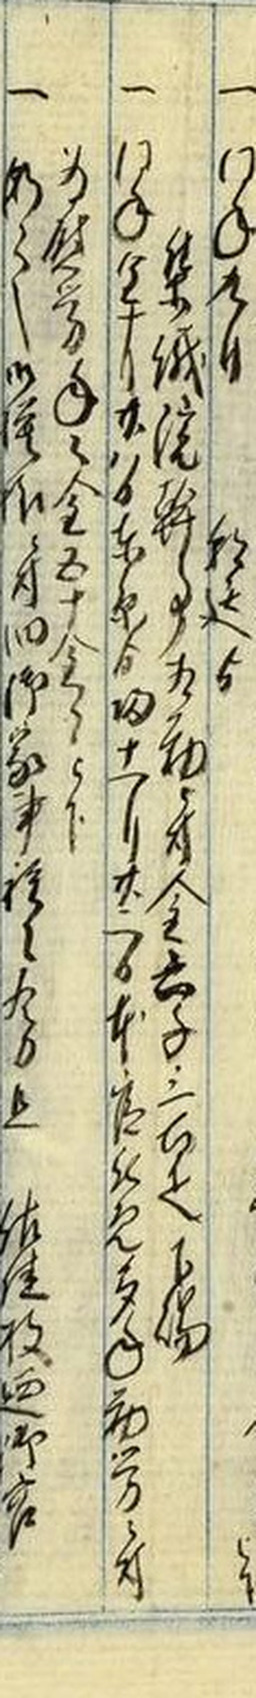一同年閏十月廿八日東京ゟ帰十一月廿二日本官被免多年勤労ニ付
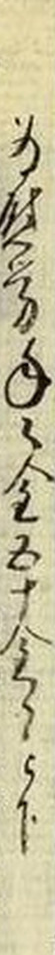為慰労年々金五十金ツヽ被下
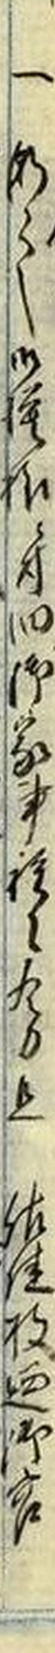一漸々之御模様ニ付旧御家中種々尽力且佐佳枝廼御宮
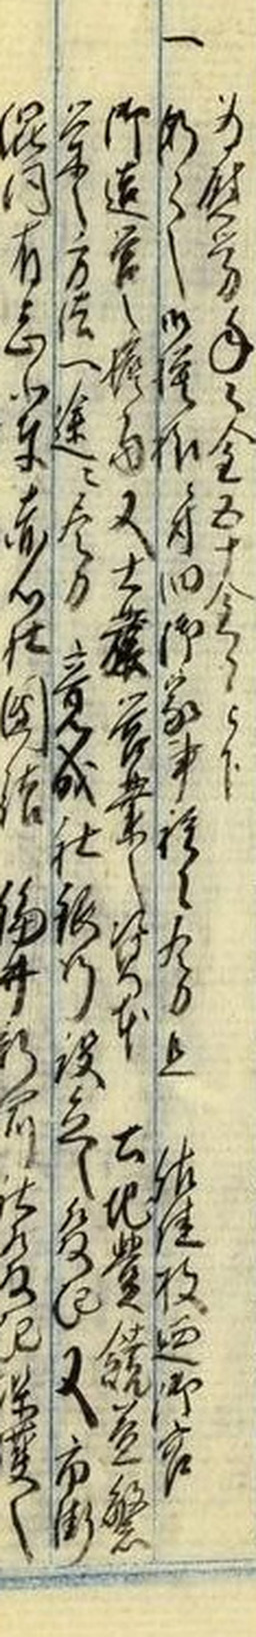御造営之際尚又士族営業之資本土地豊饒益繁
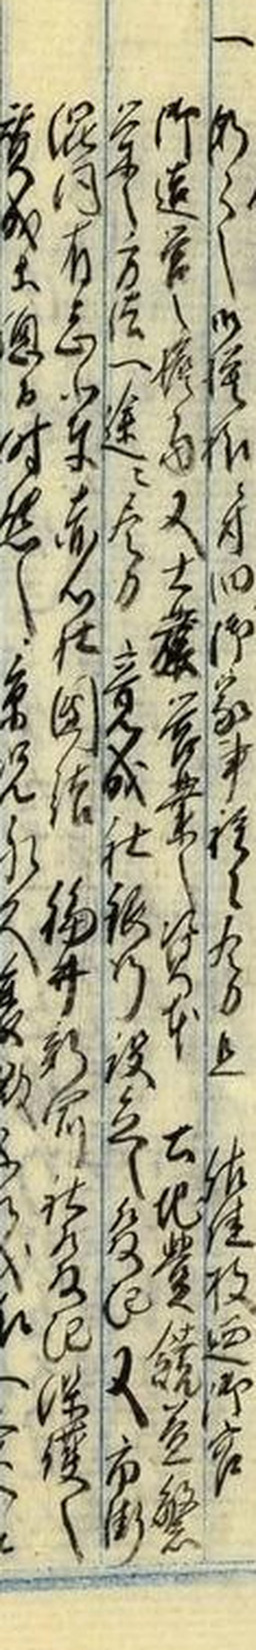栄之方法一途ニ尽力竟成社銀行設立之発起又市街
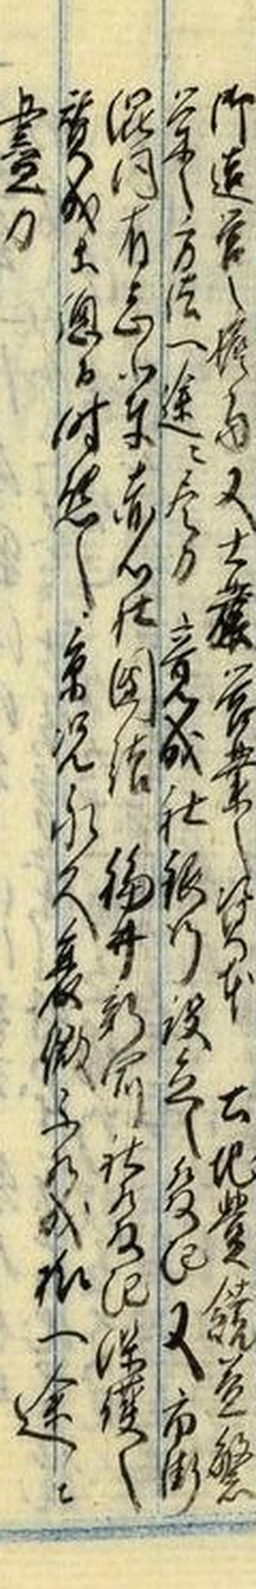混同有志輩赤心社団結福井新開社発起保護之
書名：温古集 三巻
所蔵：福井県文書館 Fukui Prefectural Archives
